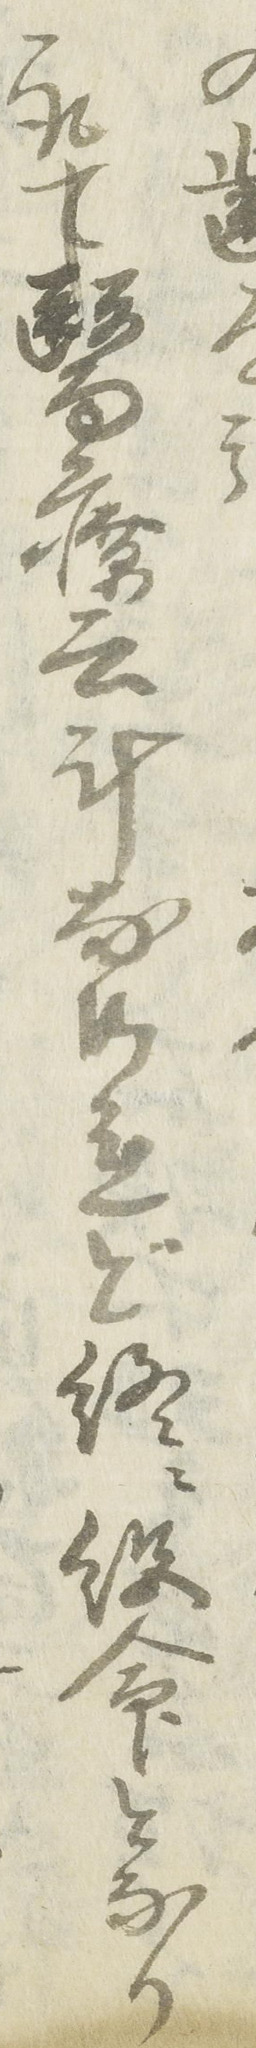死て医療云計なけれど終に終命となり
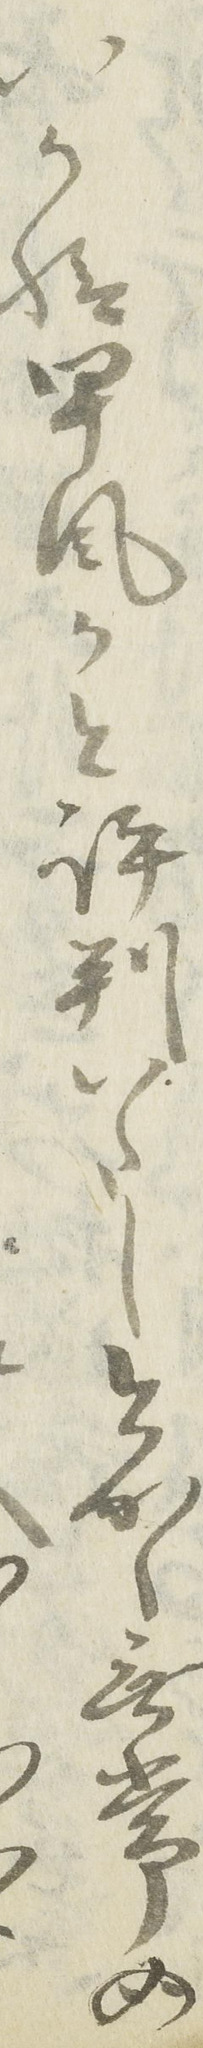いか様早風かと評判いたしとかく無常の
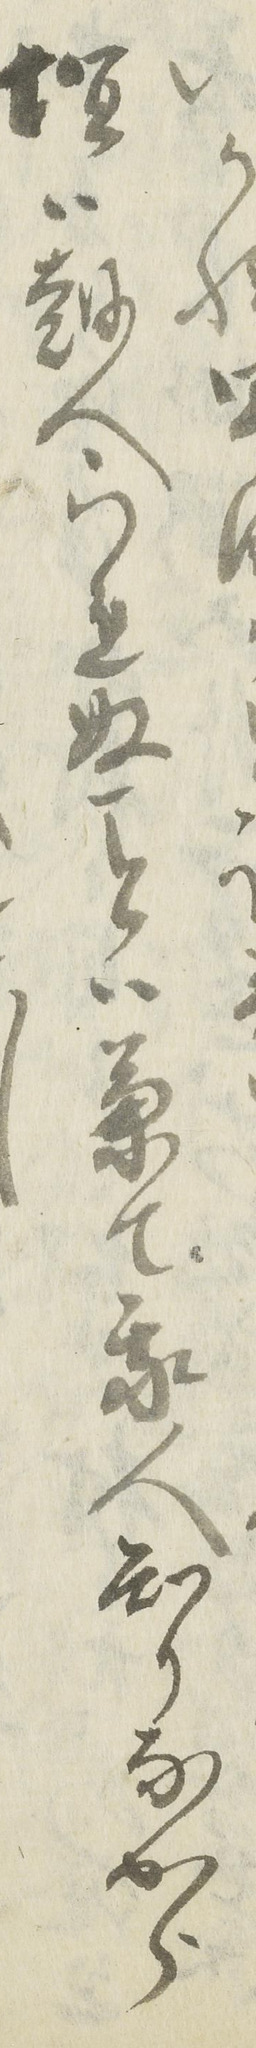垣は越へられぬことは兼て我人知りなから
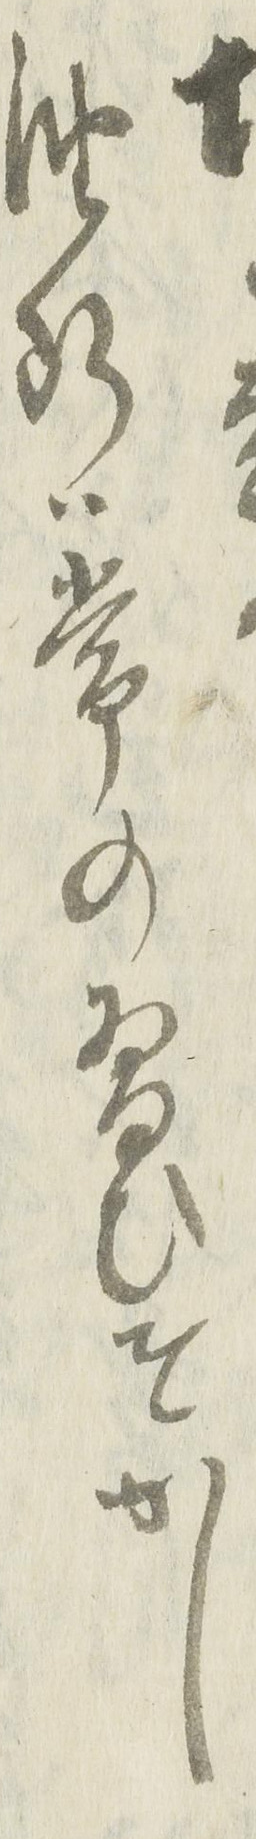油断は常の習ひそかし
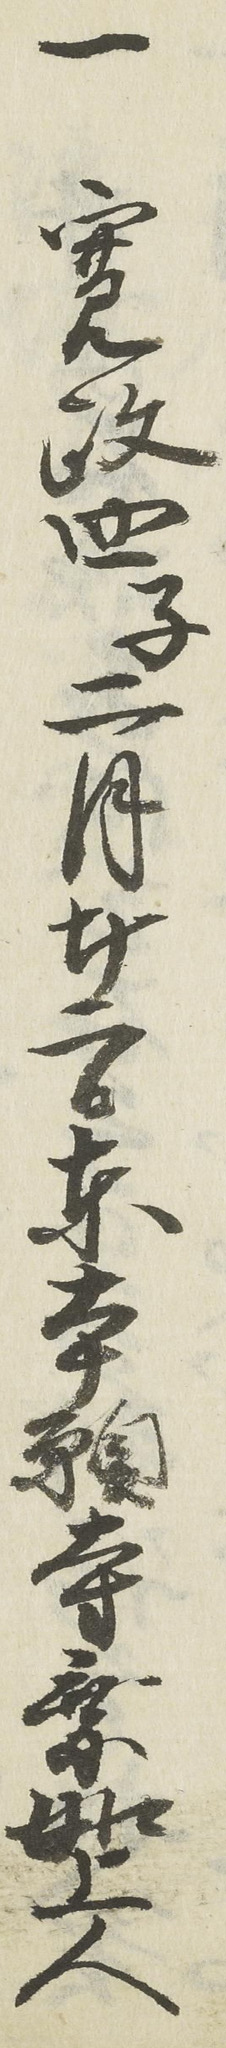一寛政四子二月廿二日東本願寺乗如上人
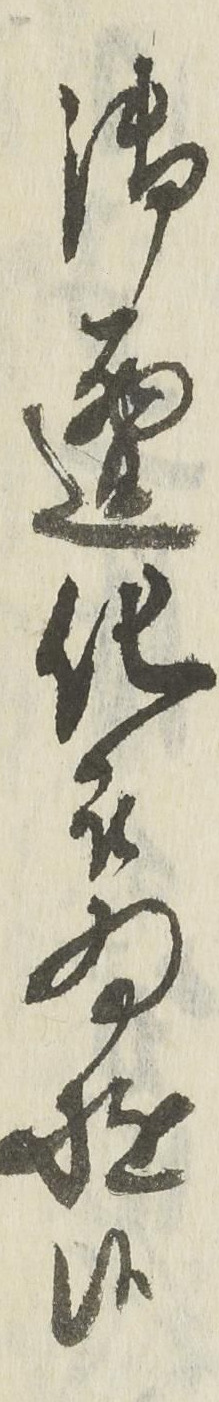御遷化被為遊候

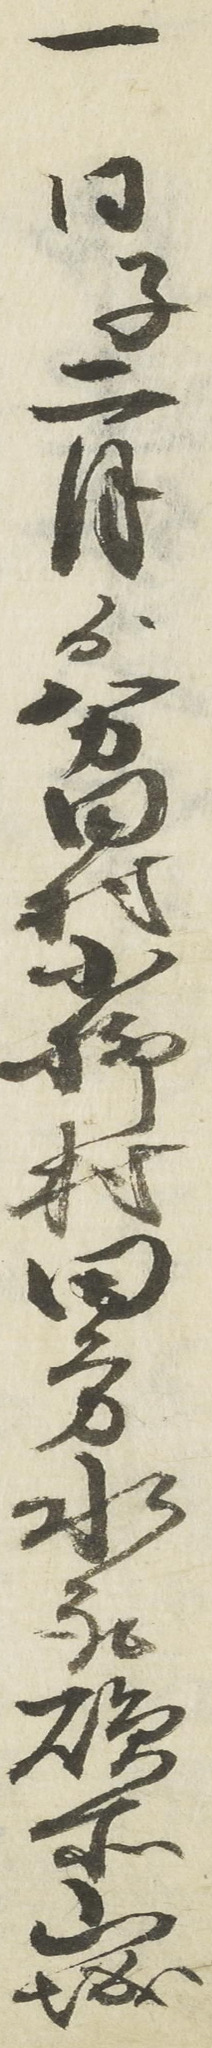一同子ニ月ゟ分田村小柳村田方水取磧所山城
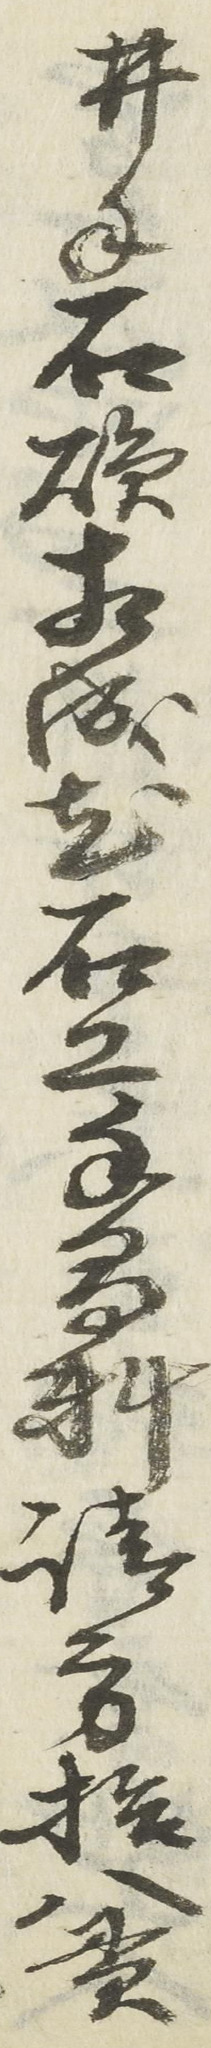井出石磧相成尤石工手間料請方拾八貫
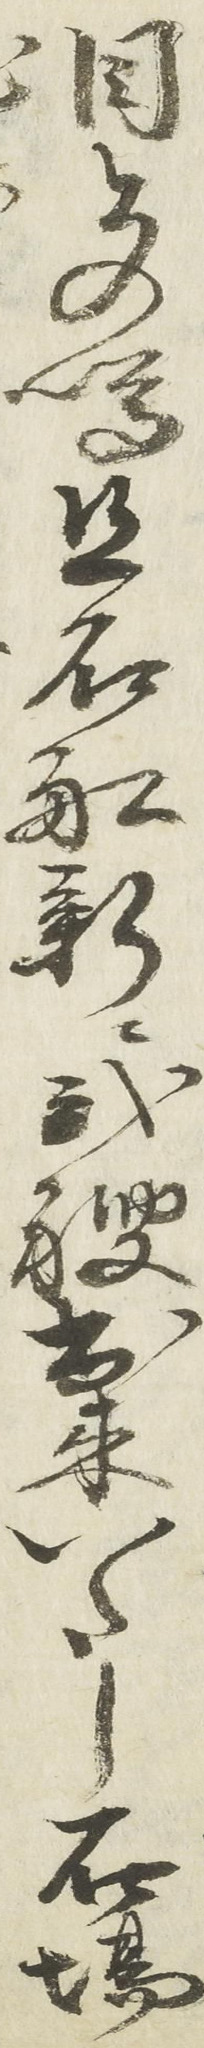目との噂且石船新ニ弐艘出来いたし石場
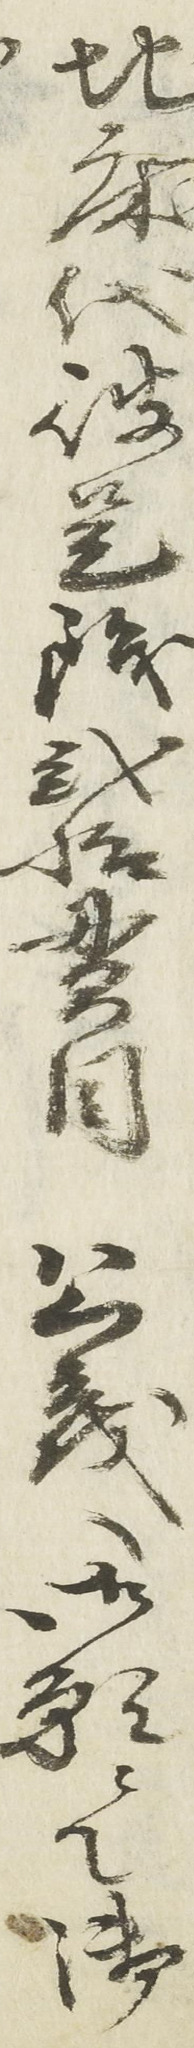地床代彼是銭弐拾貫目公義へ御願ニて御
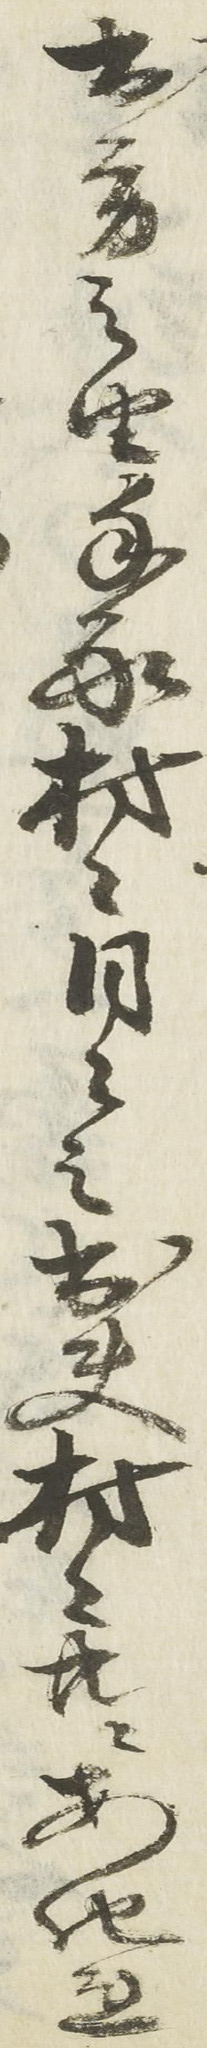出方の由手永村々日々之出夫村々共ニあゆれ
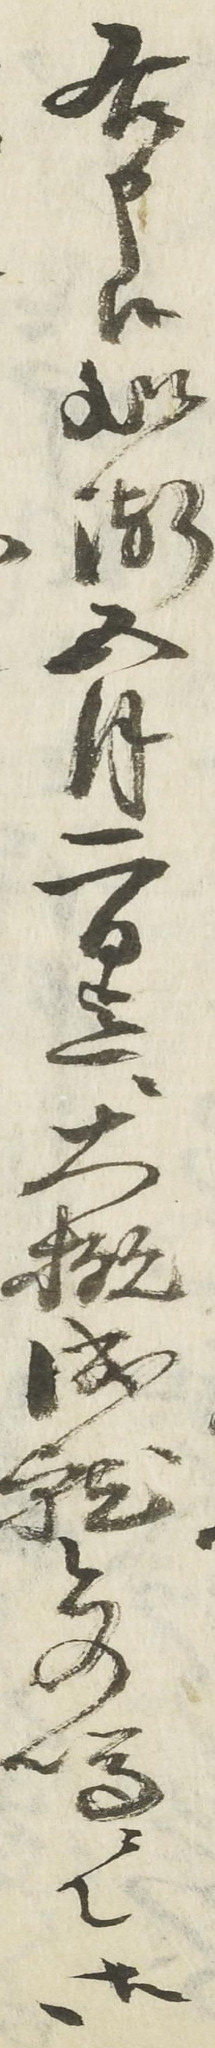右申候処漸五月二日迄ニ大概成就との噂ニて御
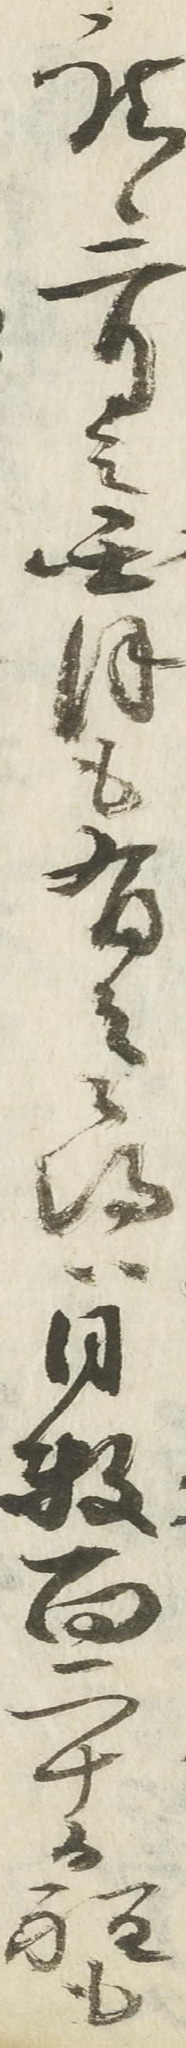座候二月之閏月も有之候得は日数百二十日程も
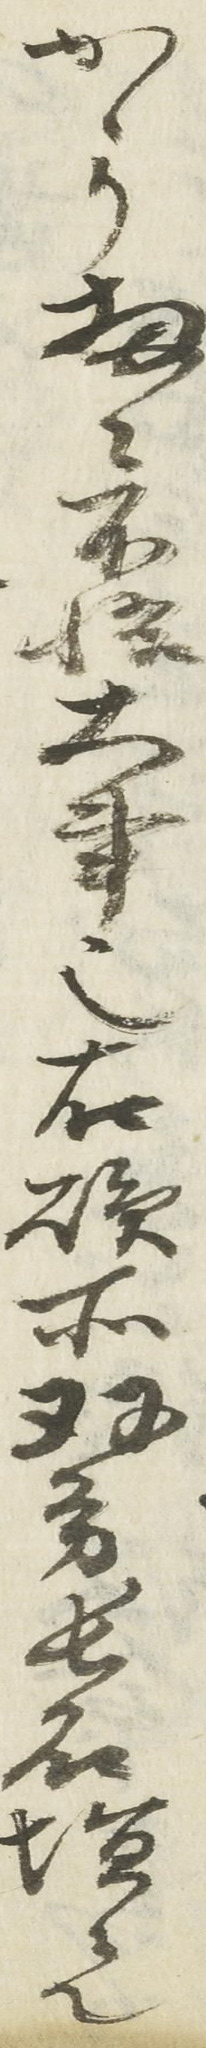かゝり扨々不悟大事也右磧所双方長石垣ニて
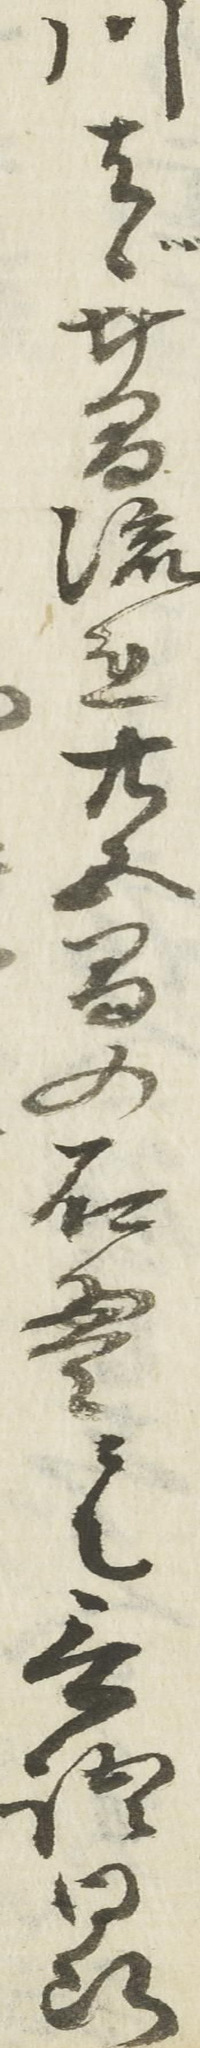川はゞ廿間流れ廿五間の石畳ニて言語同断
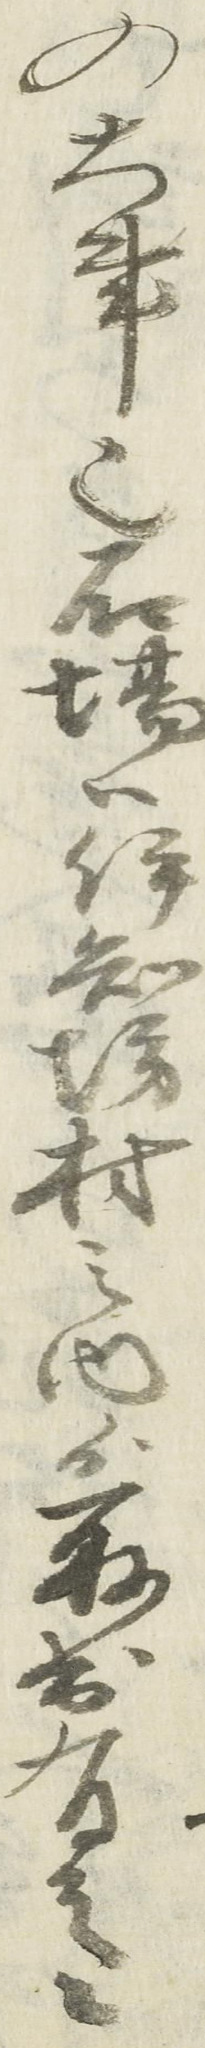の大事也石場は伊知坊村之内ゟ取出有之候
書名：後見笑
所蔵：東京大学地震研究所図書室 Earthquake Research Institute Library, The University of Tokyo, JAPAN
